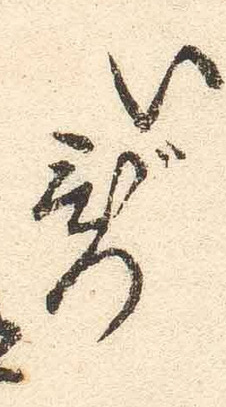いびつと
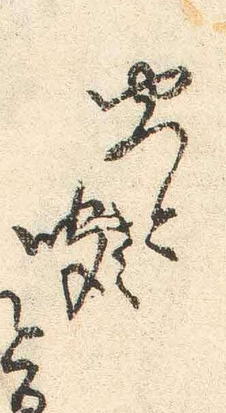やつと
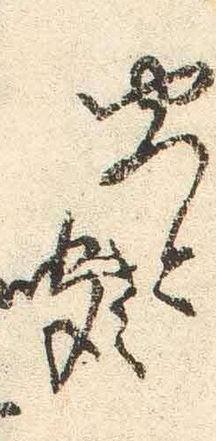やつと
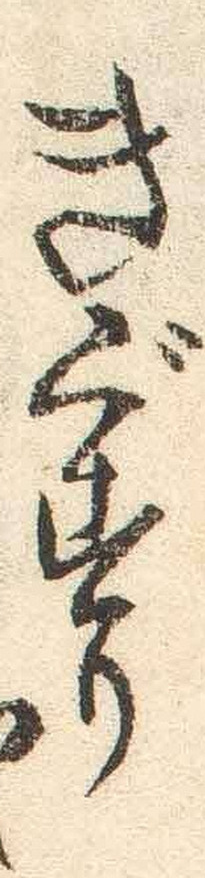きぐすり
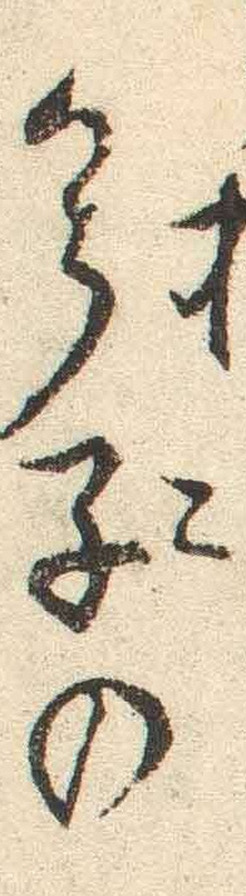から子の
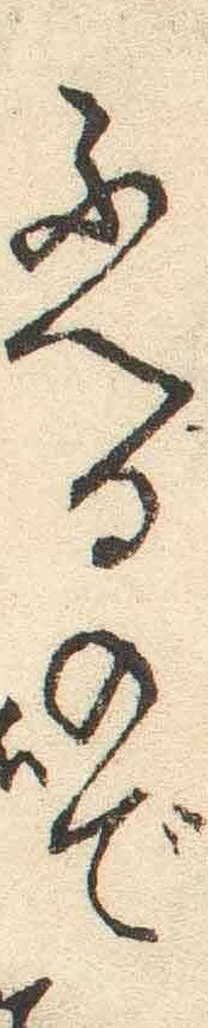ふへるので
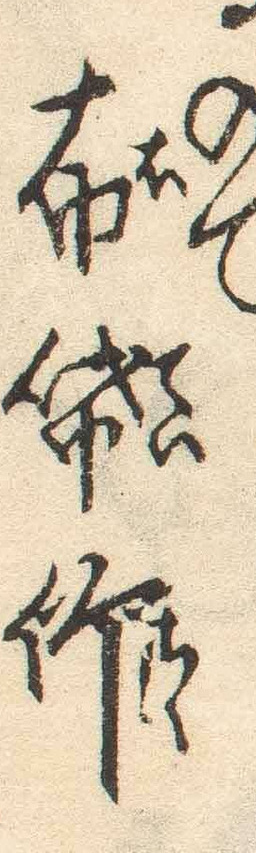布袋竹

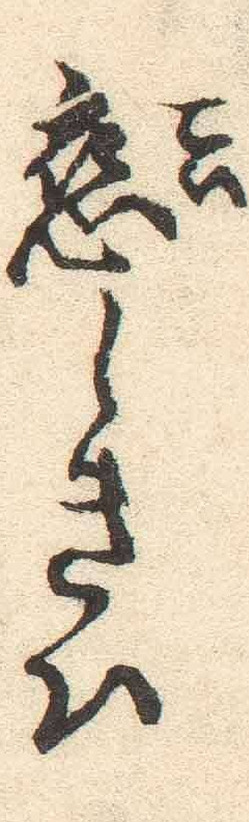恋しきは
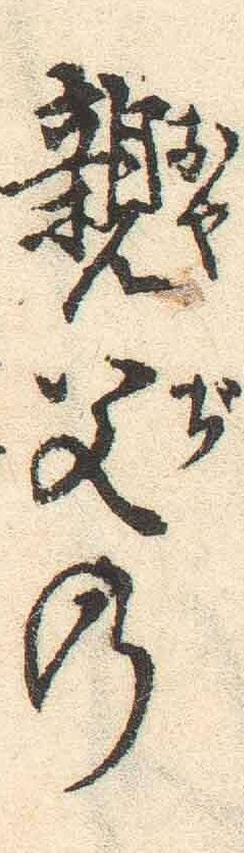親父の
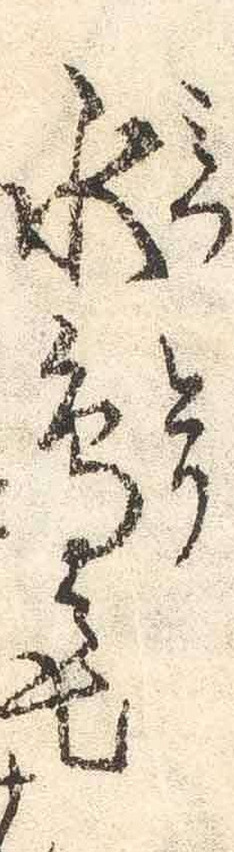水鳥も
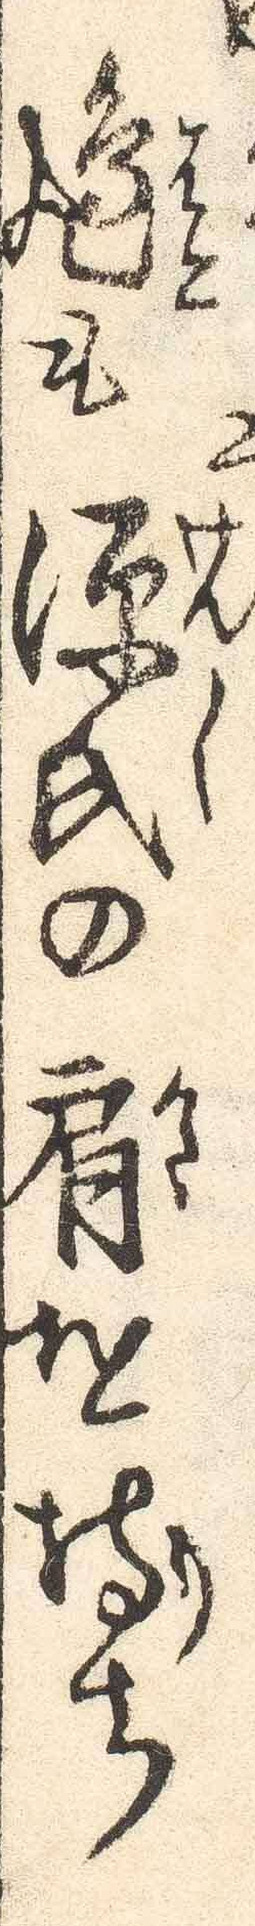鳩も源氏の肩を持ち
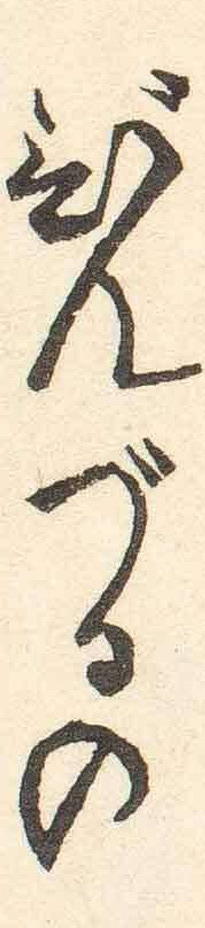びんづるの
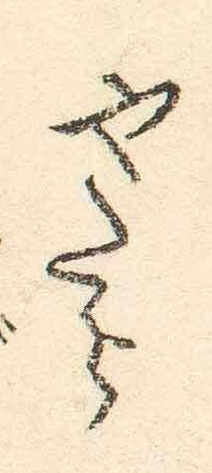やたら
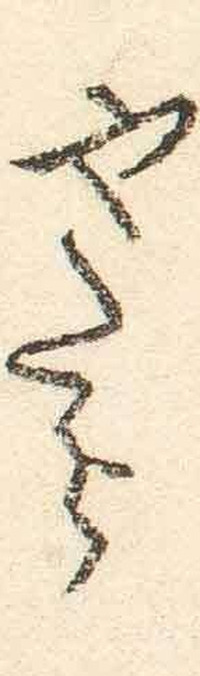やたら
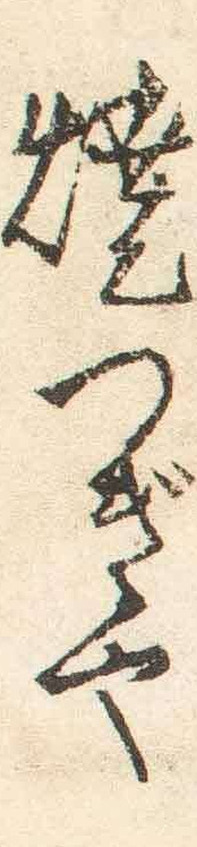焼つぎや

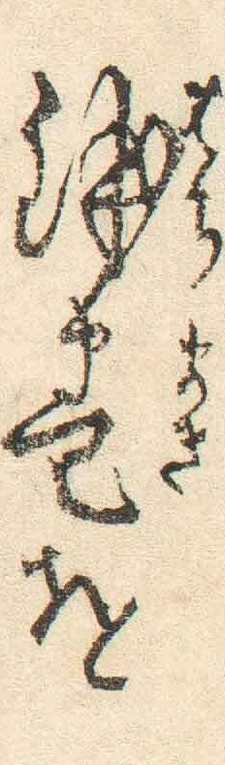鉢巻を
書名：画本柳樽
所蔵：東京学芸大学附属図書館 国文学研究資料館
